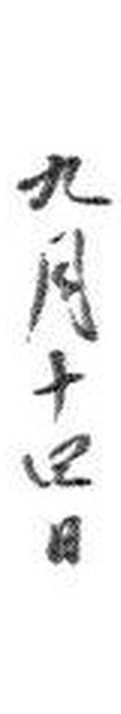九月十四日
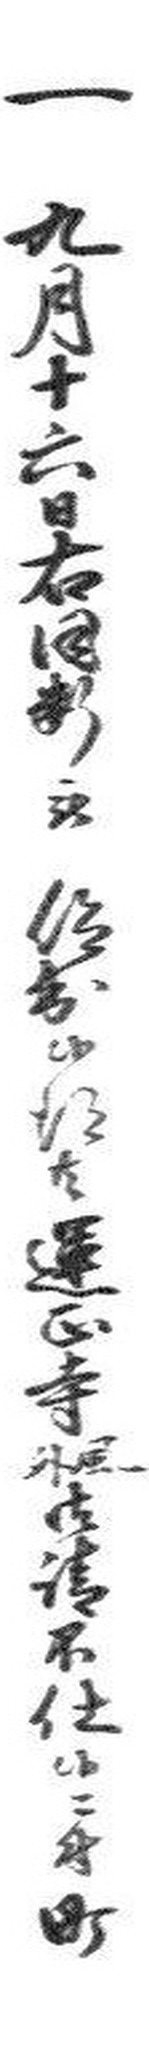一九月十六日右同断被仰出候得共運正寺風外御請不仕候ニ付町
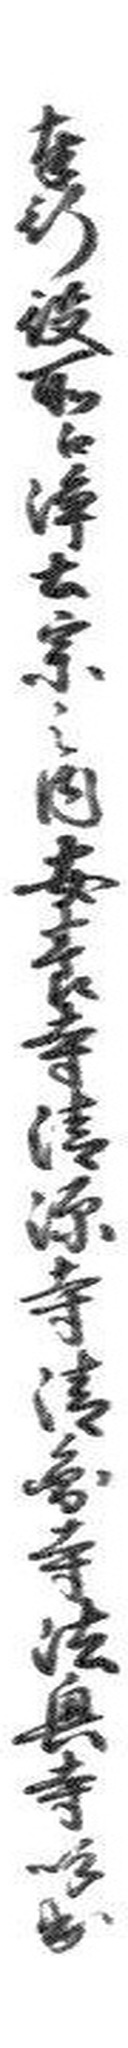奉行役所江浄土宗之内安養寺清源寺清円寺法奥寺呼出
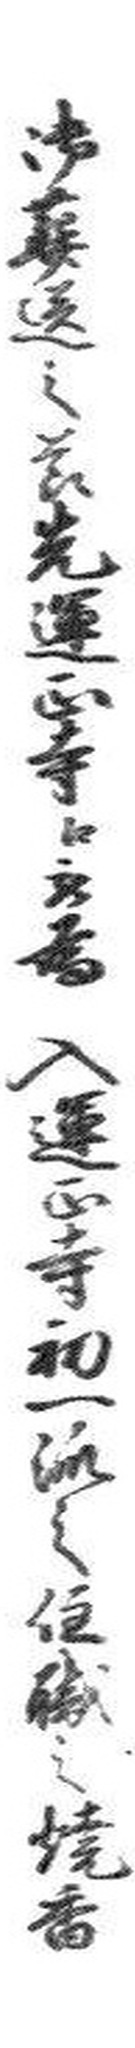御葬送之節先運正寺江被為入運正寺初一派之住職之焼香
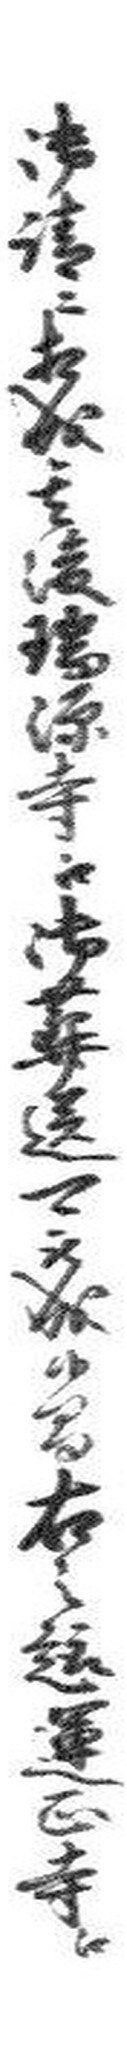御請ニ相成其後瑞源寺江御葬送可被成候間右之趣運正寺江
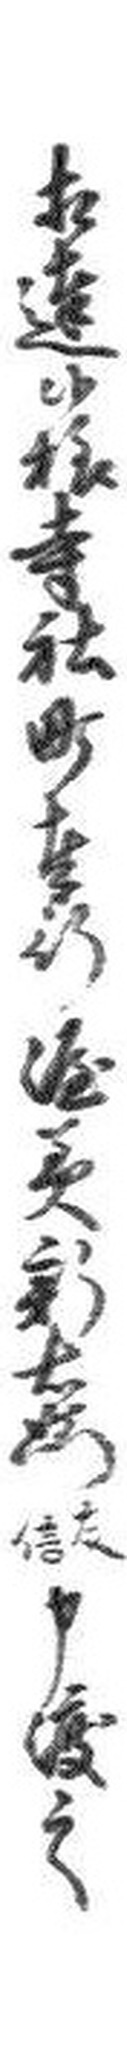相達候様寺社町奉行渥美新右衛門友信申渡之候
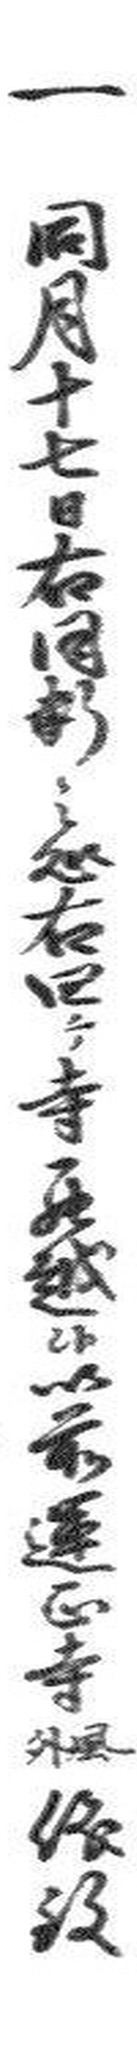一同月十七日右同断之処右四ヶ寺罷越候以前運正寺風外儀致

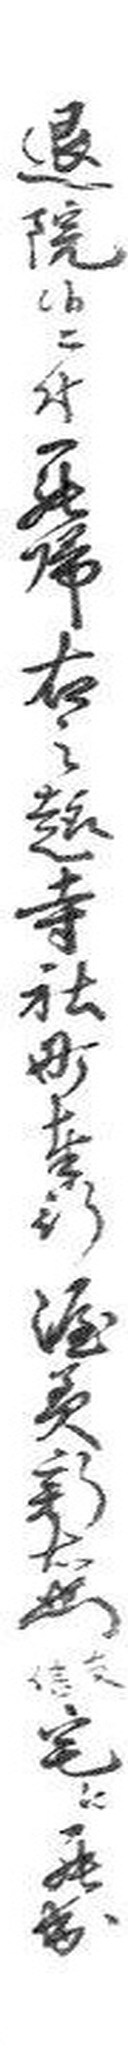退院候ニ付罷帰右之趣寺社町奉行渥美新右衛門友信宅江罷出
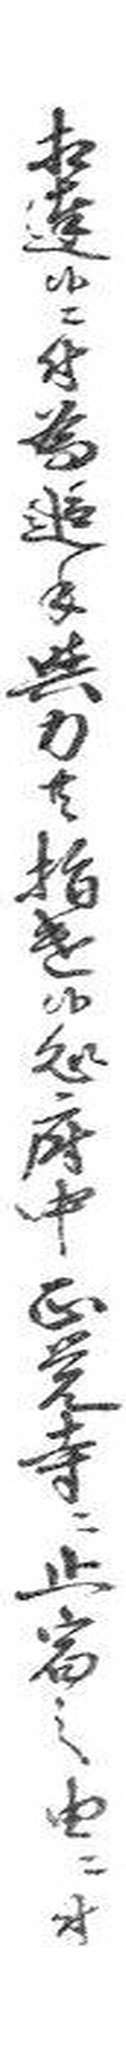相達候ニ付為追手与力共指遣候処府中正覚寺ニ止宿之由ニ付
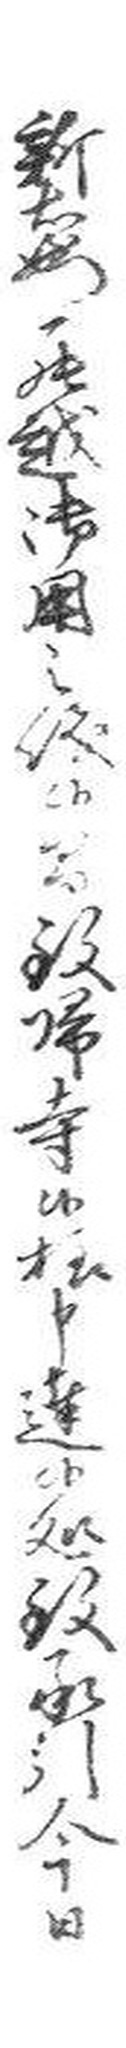新右衛門罷越御用之儀候間致帰寺候様申達候処致承引今日
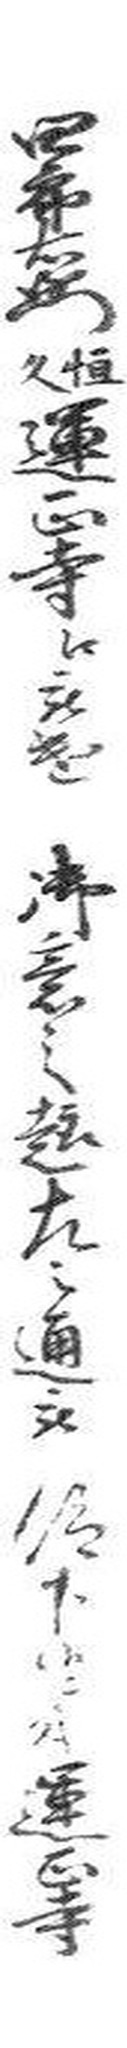四郎右衛門恒久運正寺江罷遣御意之趣左之通被仰下候ニ付運正寺
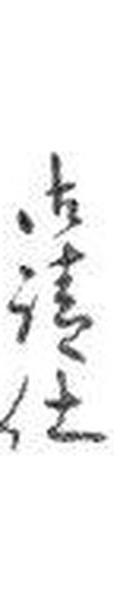御請仕
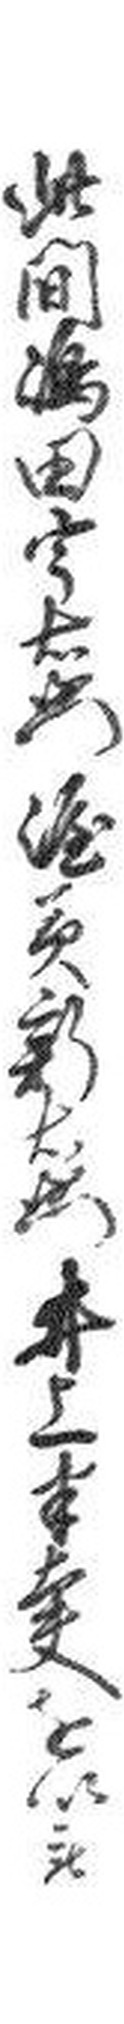此間嶋田宇右衛門渥美新右衛門井上半大夫を以被
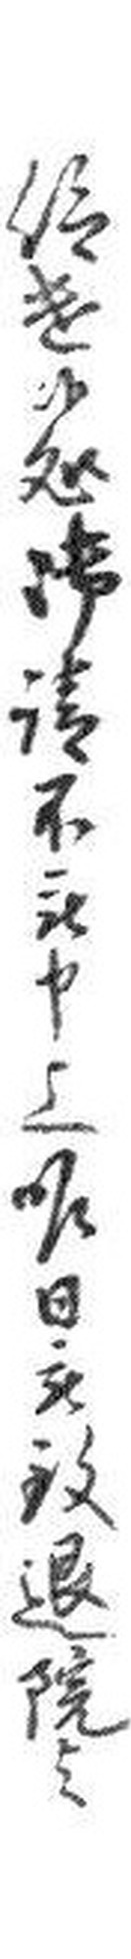仰遣候処御請不被申上昨日被致退院と
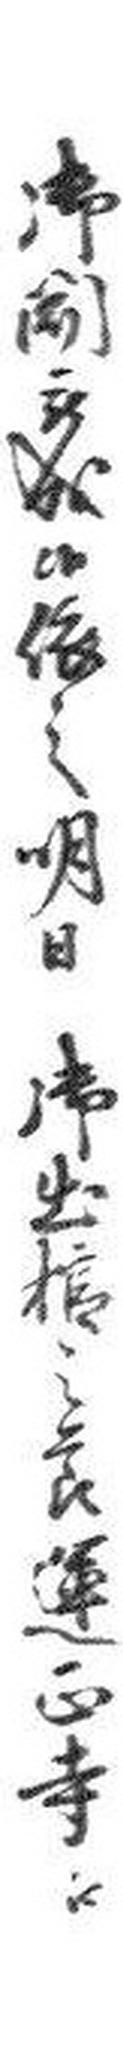御聞被成候依之明日御出棺之節運正寺江
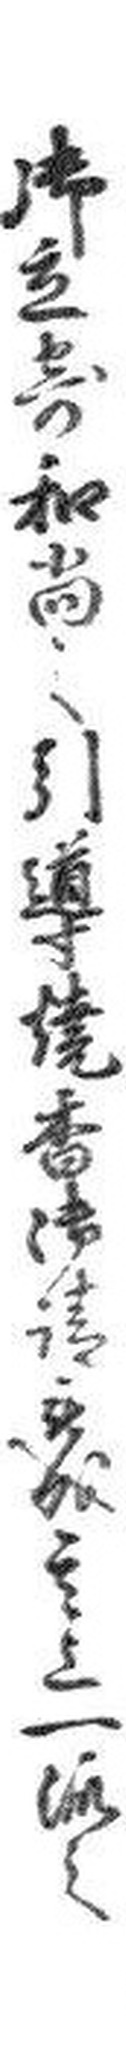御立寄和尚之引導焼香御請被成其上一派之
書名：家譜 二十六 吉品公 従宝永七年到正徳二年
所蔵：福井県文書館 Fukui Prefectural Archives
